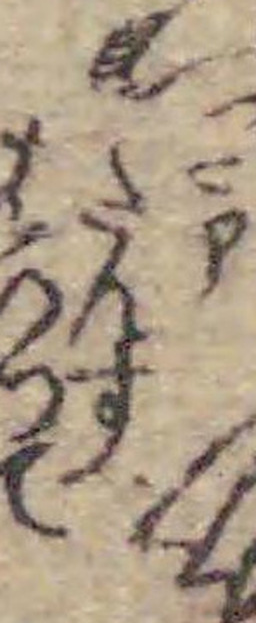たんす
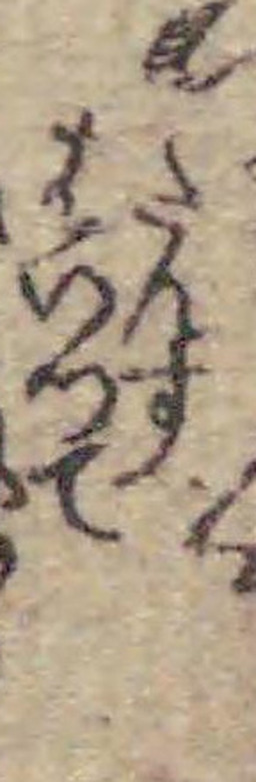はいつて
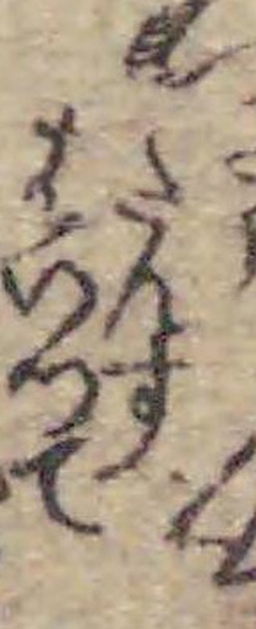はいつて
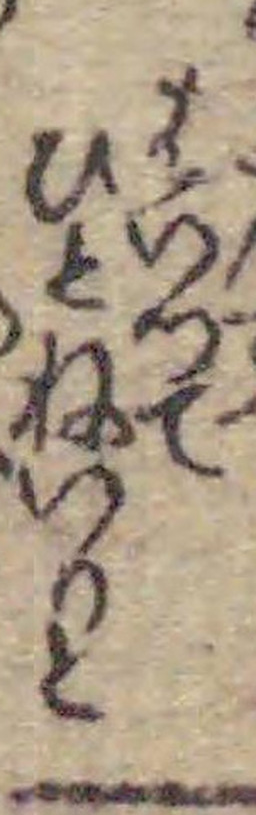ひとねいりと
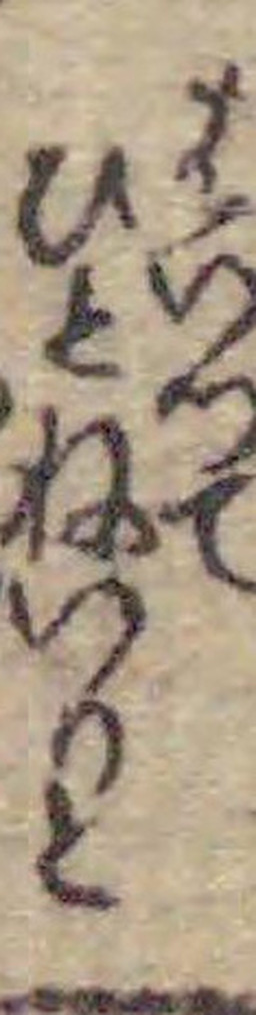ひとねいりと
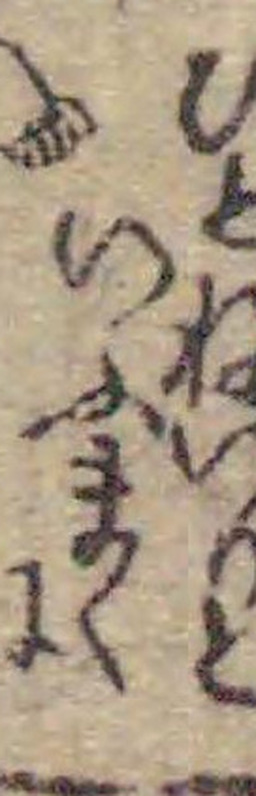いふまく
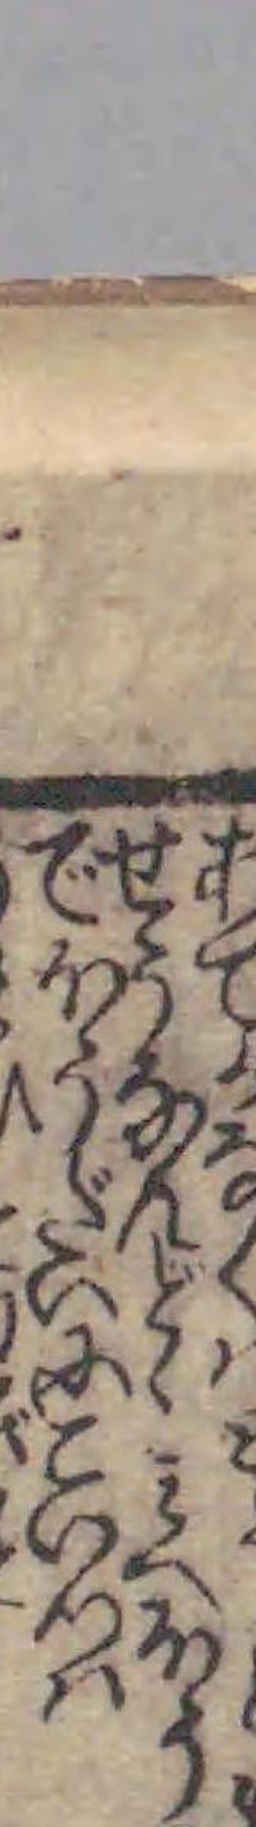でほうだいにこいつは
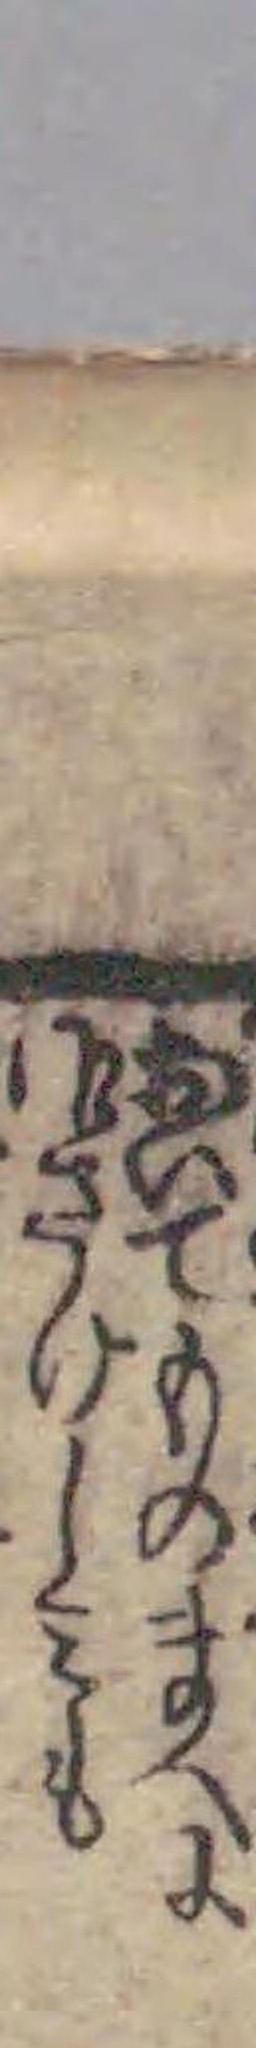御さけしみも
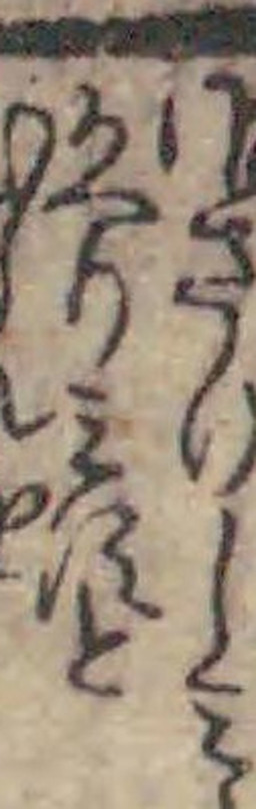かへりみすと
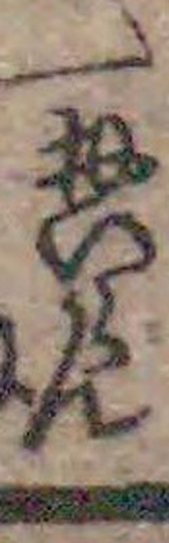おいらん
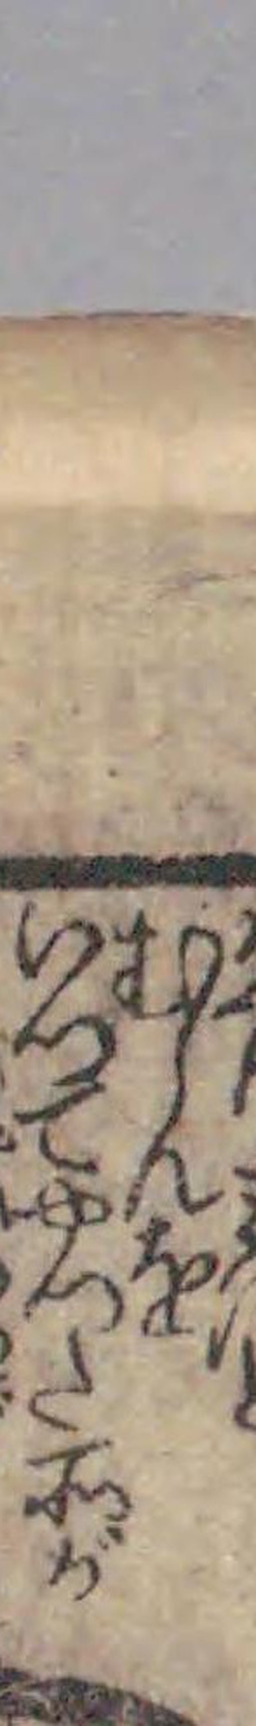いつてやつた所が
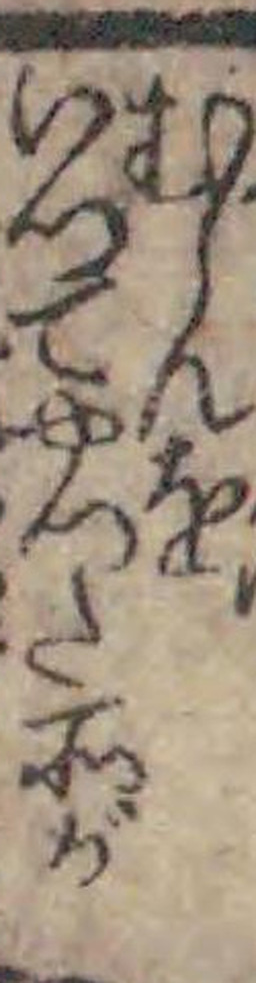いつてやつた所が
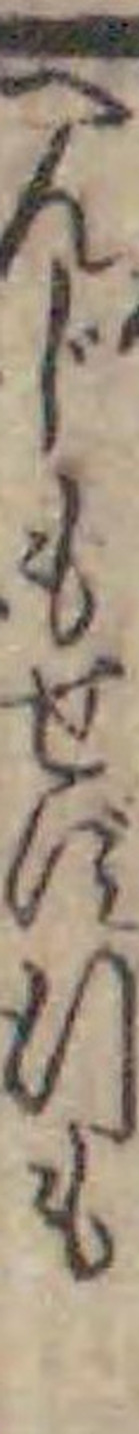へんじもせず行も
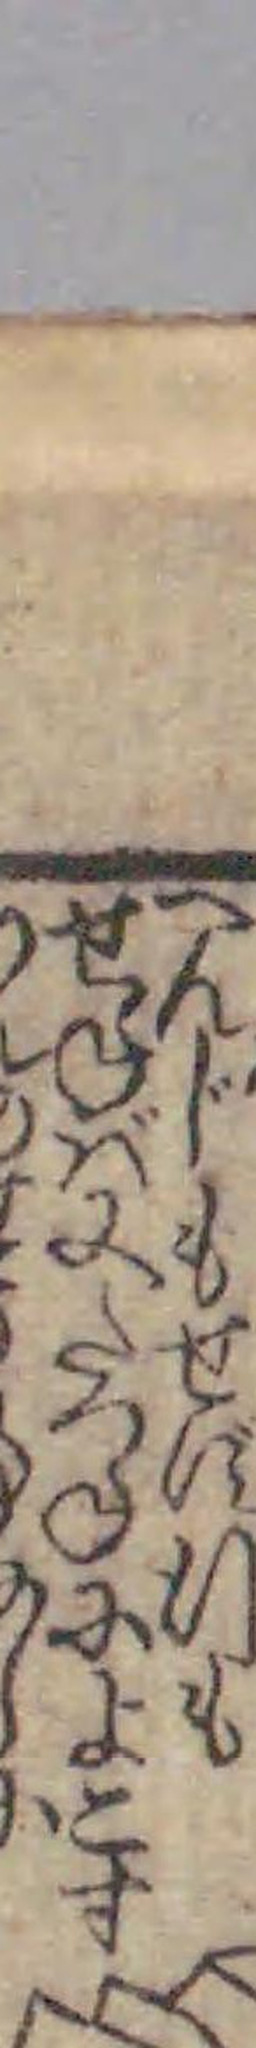せねば又たつねによこす
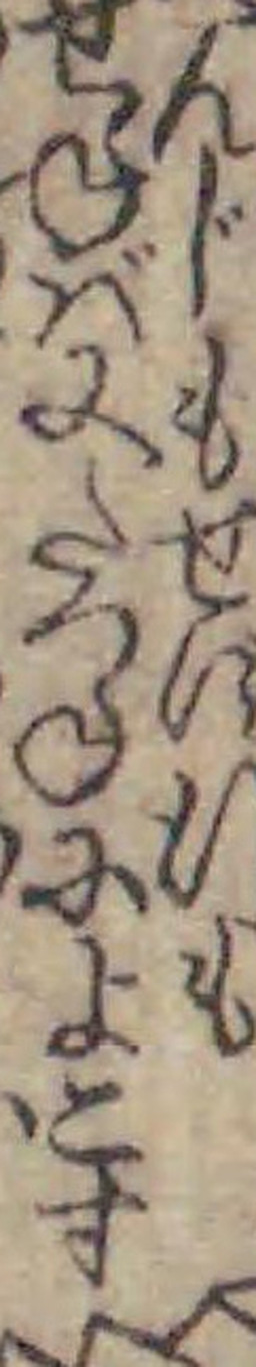せねば又たつねによこす
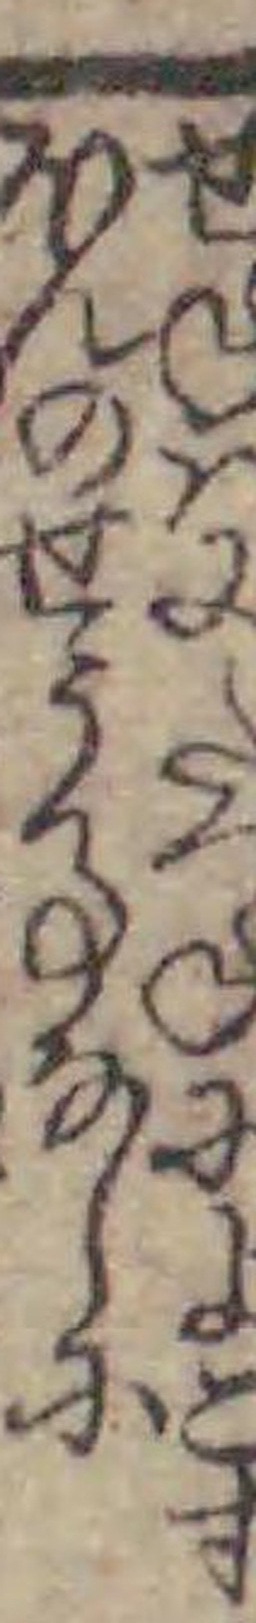ほんのせう事なしに
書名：新鋳小判 : 3巻
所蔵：国立国会図書館 National Diet Library, JAPAN
